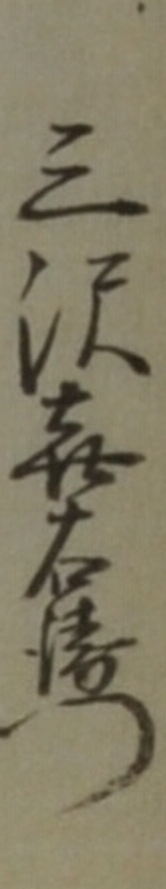三沢喜右衛門
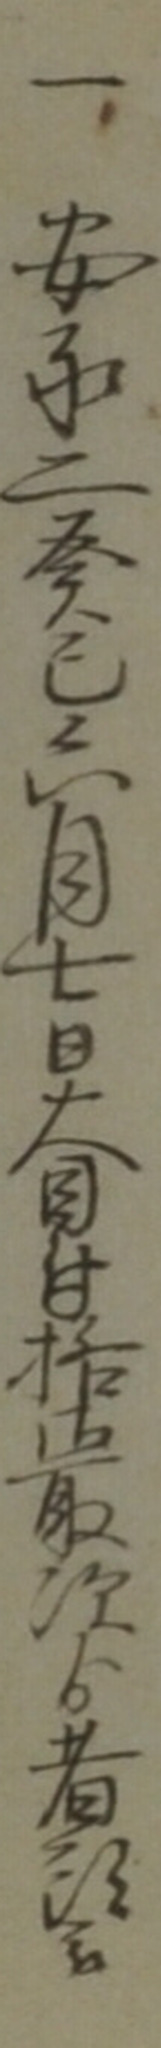一安永二癸巳六月七日大目付格御取次ゟ者頭被
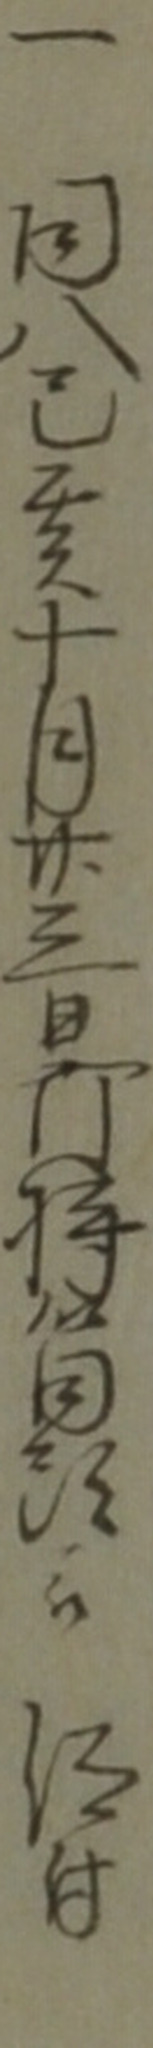一同八己亥十月廿三日御持筒頭被仰付
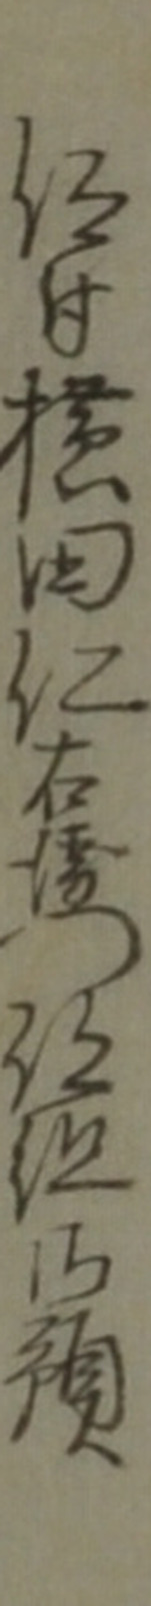仰付横田仁右衛門跡組御預
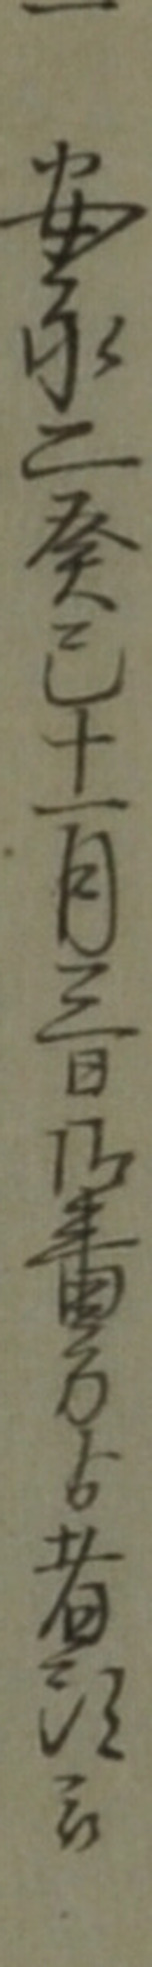一安永二癸巳十一月三日御番方ゟ者頭被
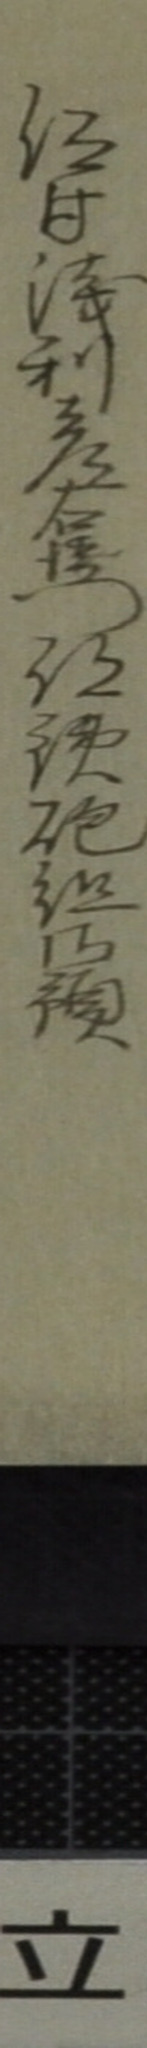仰付浅利彦右衛門跡鉄砲組御預
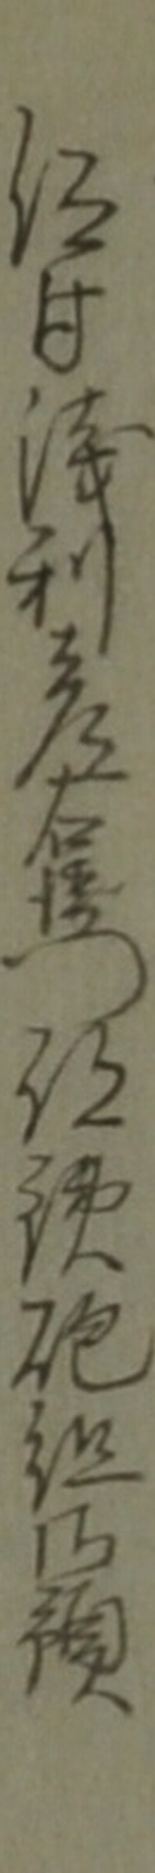仰付浅利彦右衛門跡鉄砲組御預
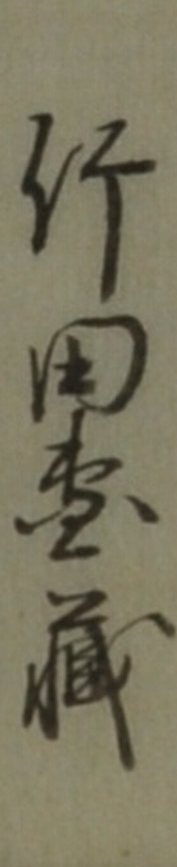竹田団蔵
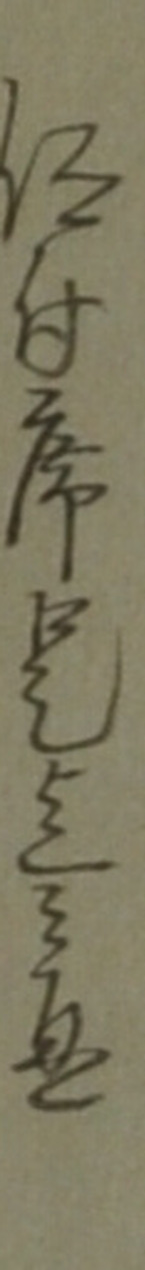仰付席是迄之通
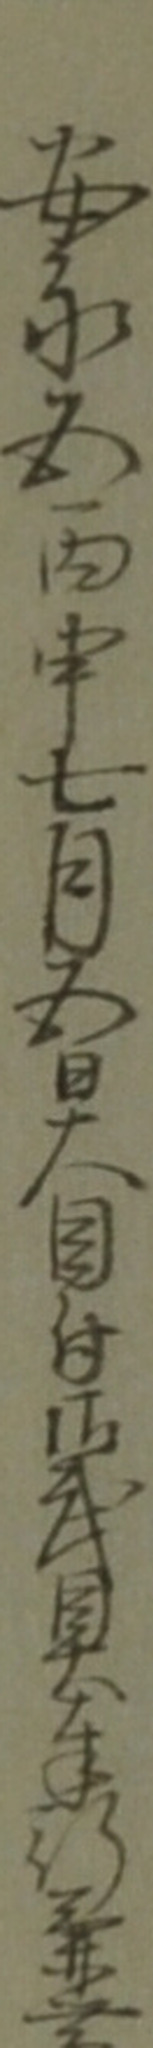一安永五丙申七月五日大目付御武具奉行兼帯ゟ
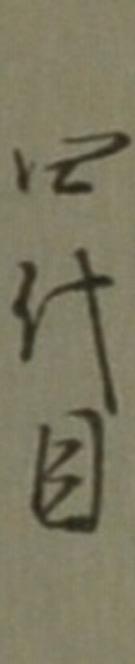四代目
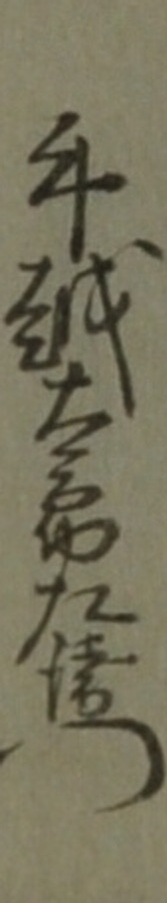牛越太郎左衛門
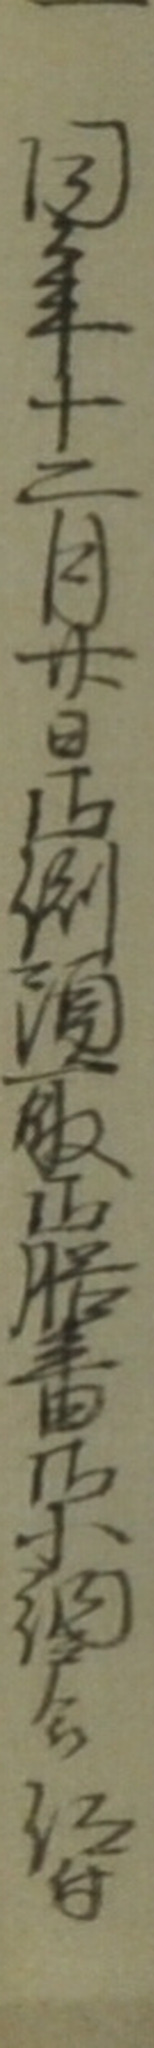一同年十二月廿日御側頭取御膳番御小納戸被仰付
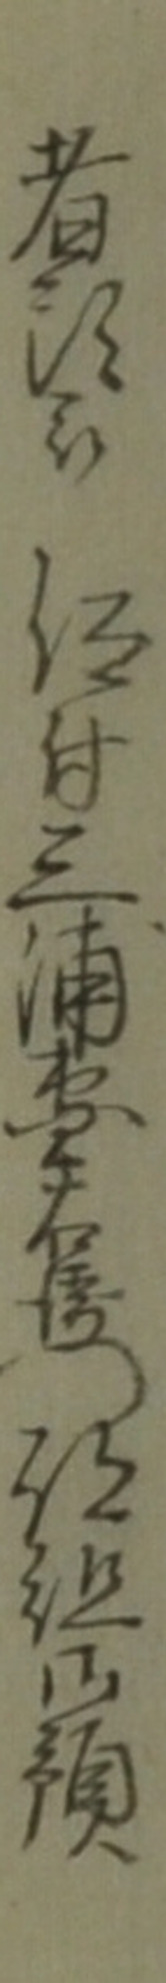者頭被仰付三浦団右衛門跡組御預

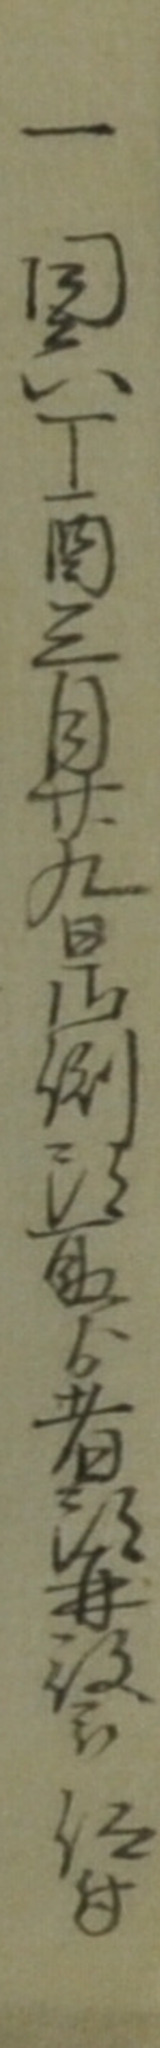一同六丁酉三月廿九日御側頭取ゟ者頭再役被仰付
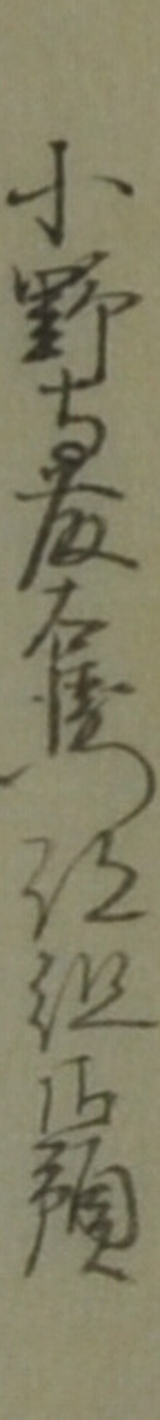小野寺藤右衛門跡組御預
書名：諸御役代々録（二）
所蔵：伊那市立高遠町図書館・合同会社AMANE
